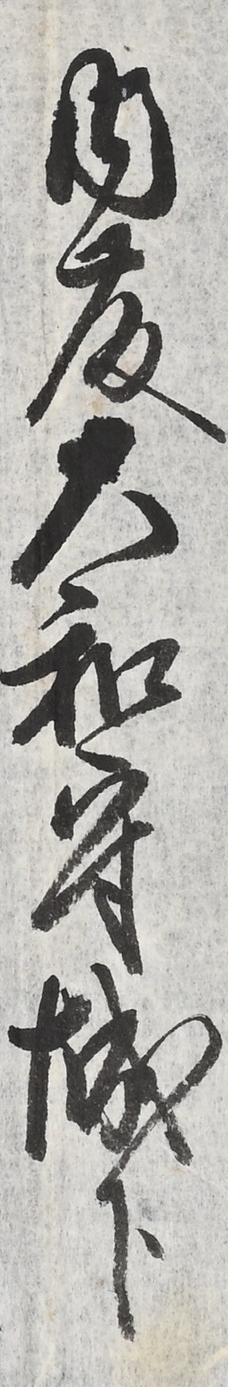内藤大和守城下
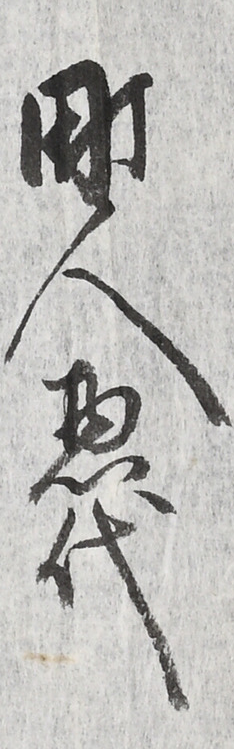町人惣代
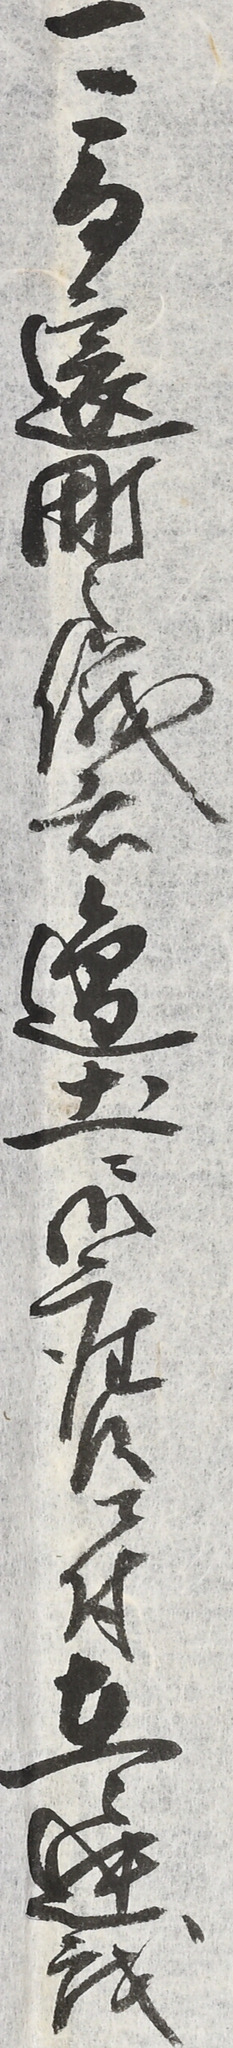一高遠町之儀は辺土ニ御座候ニ付在ニ迚も
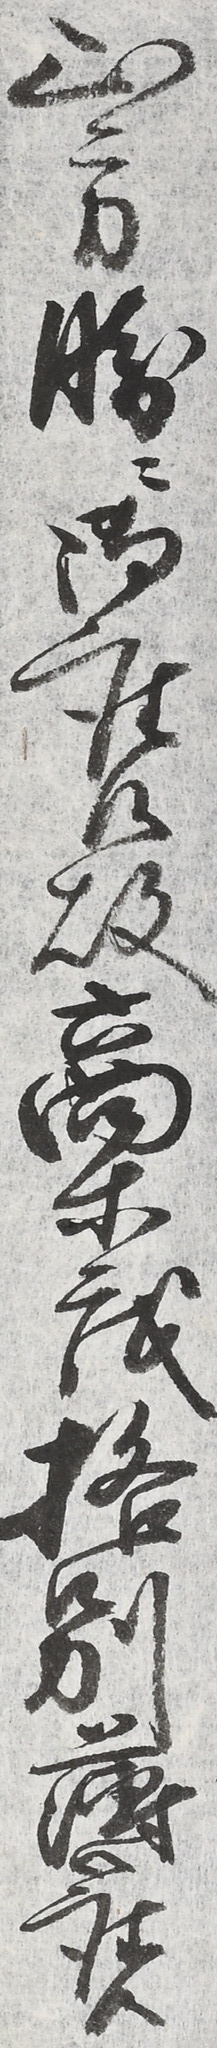山方勝ニ御座候故商等も格別薄御座候
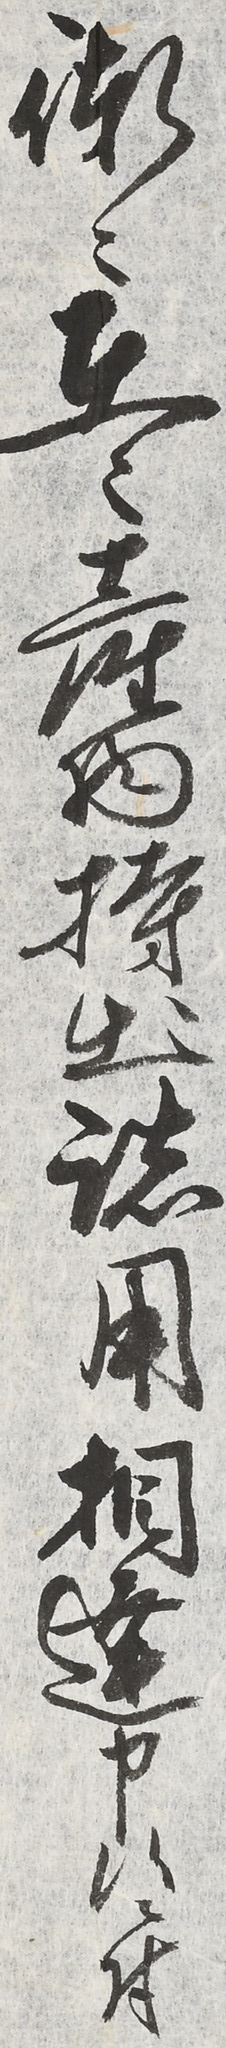漸々在々産物持出諸用相違申候ニ付
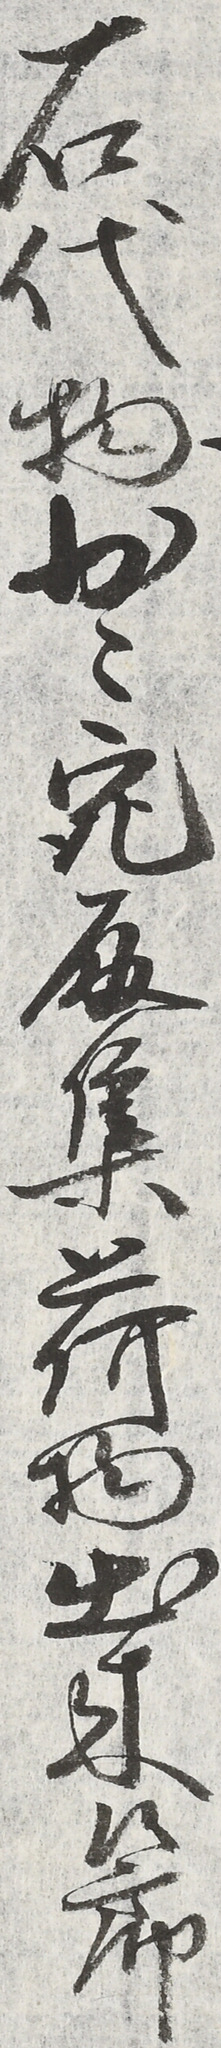右代物少々宛取集荷物出来候節
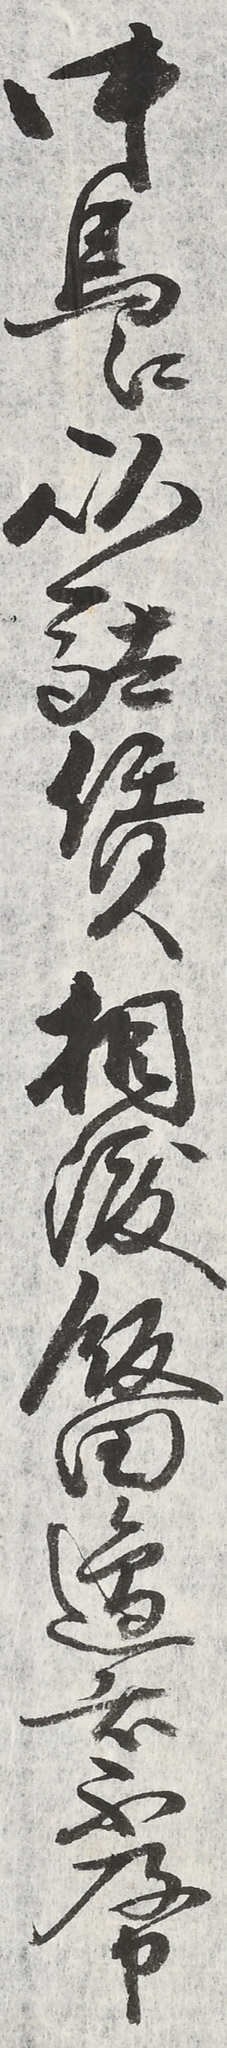中馬江以駄賃相渡飯田辺は不及申
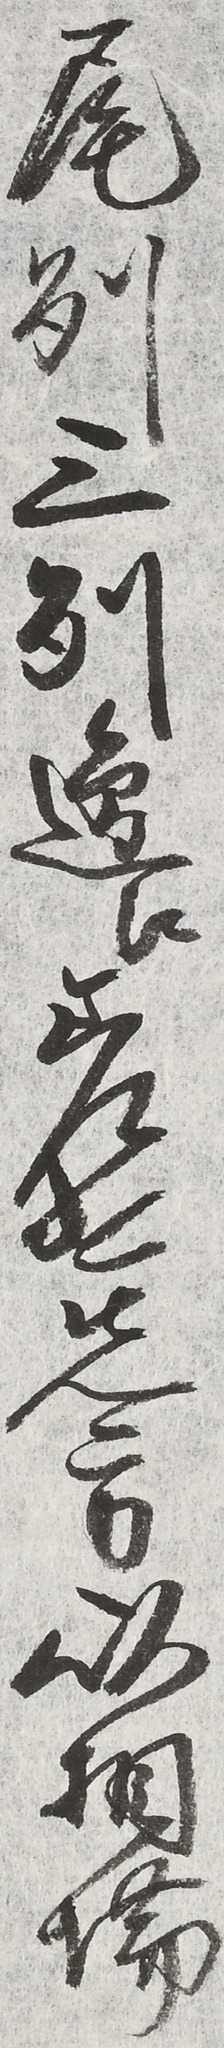尾州三州辺江差出先方以相場
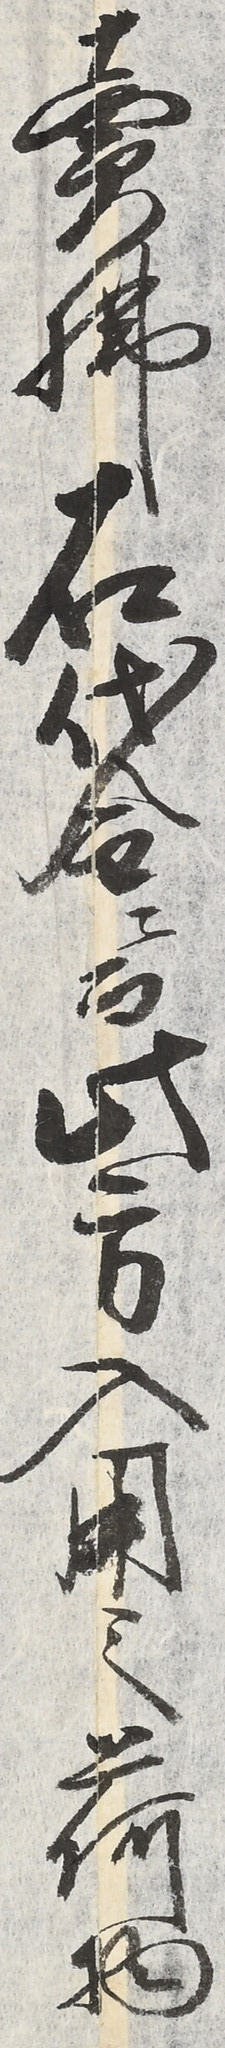売払右代金ニ而此方入用之荷物
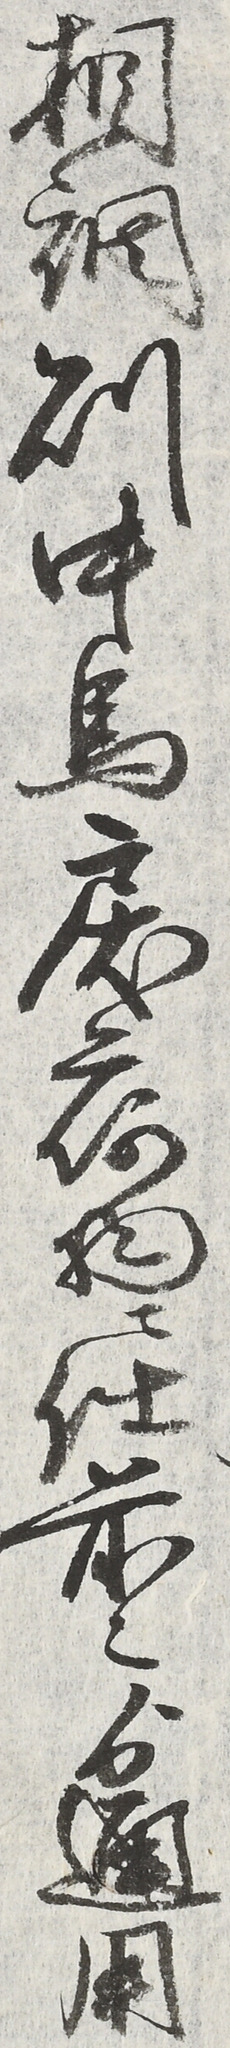相調則中馬戻荷物ニ仕前々ゟ通用
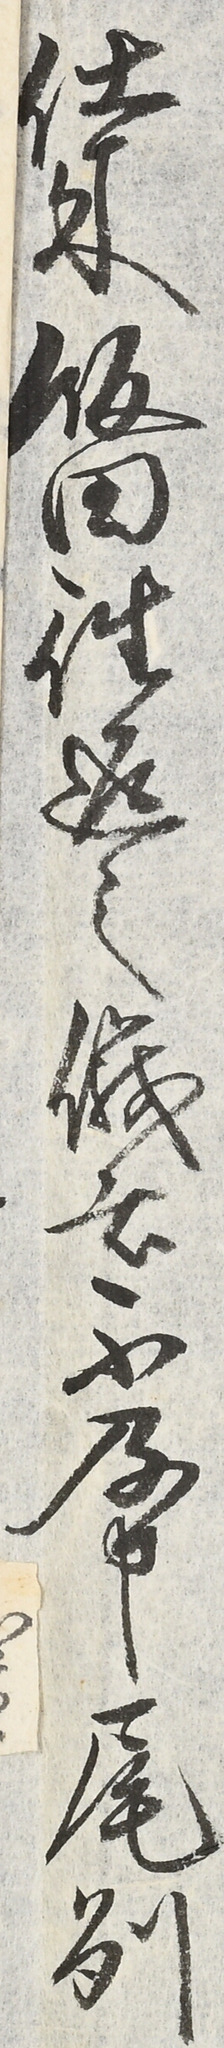仕来飯田往返之儀は不及申尾州

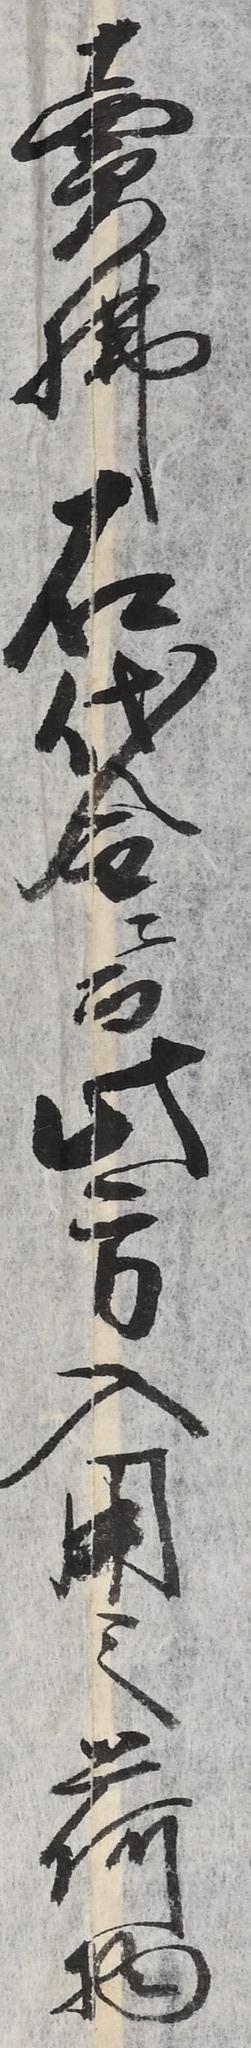売払右代金ニ而此方入用之荷物
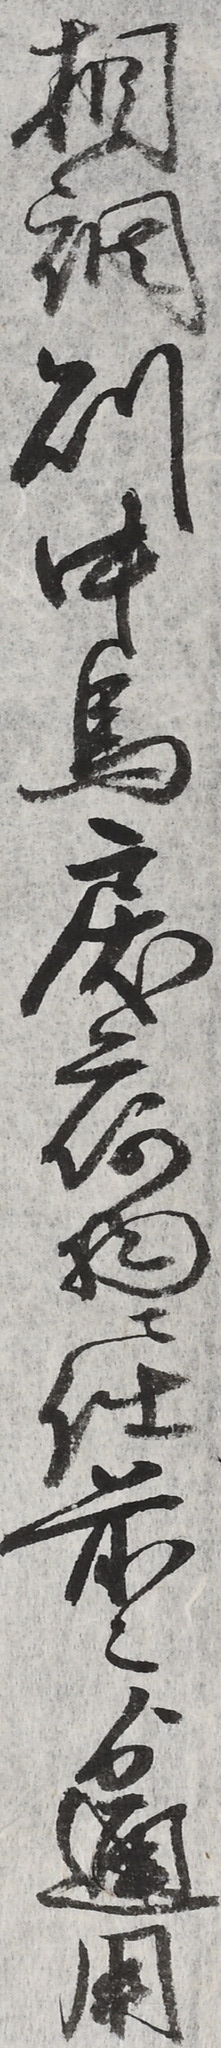相調則中馬戻荷物ニ仕前々ゟ通用
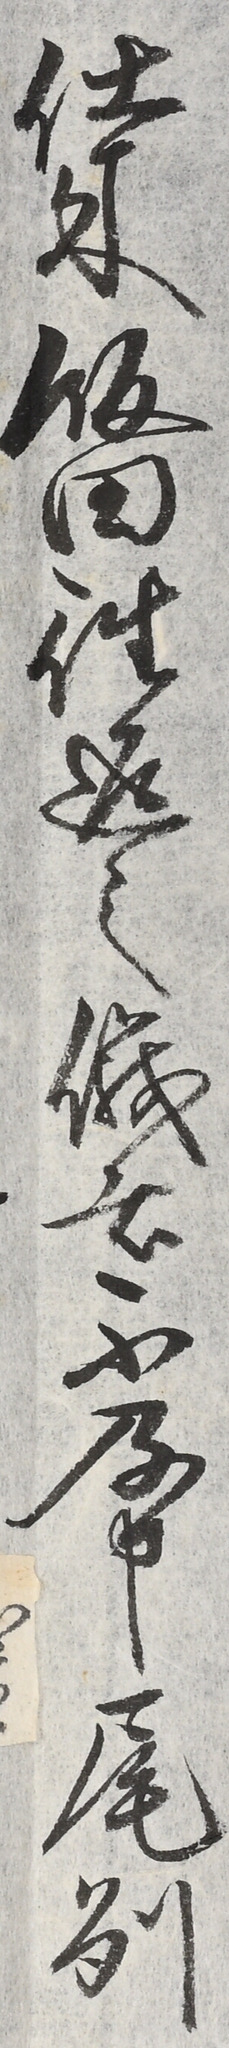仕来飯田往返之儀は不及申尾州
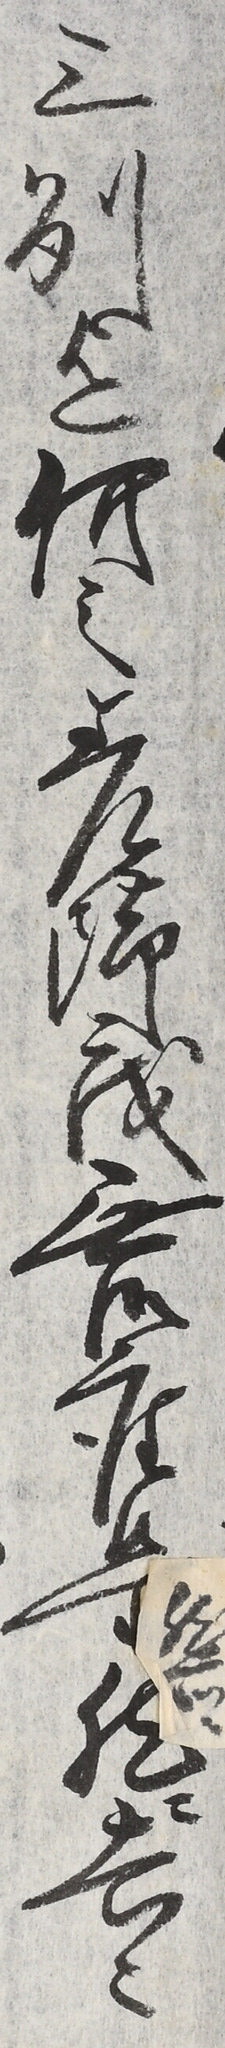三州迄何之差障も無御座候「然所ニ」去々
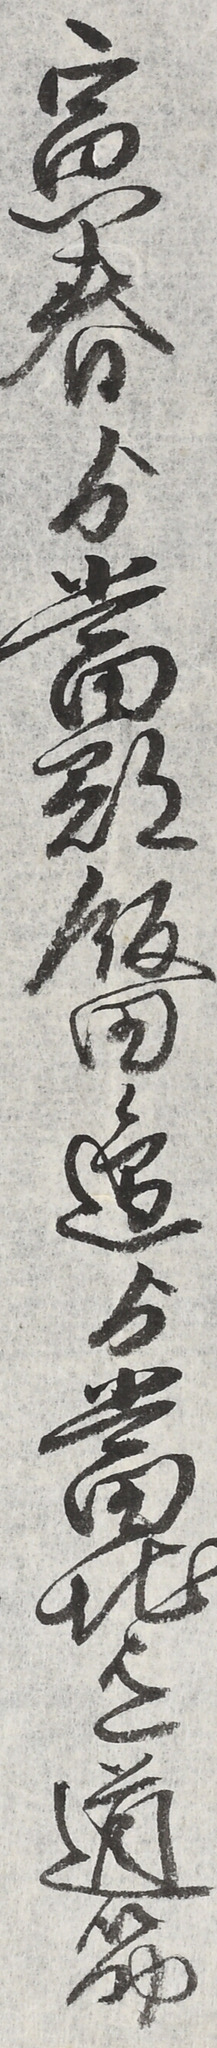寅春ゟ当郡飯田辺ゟ当地迄道筋
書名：乍恐以書付御訴訟申上候御事
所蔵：伊那市立高遠町図書館・合同会社AMANE
